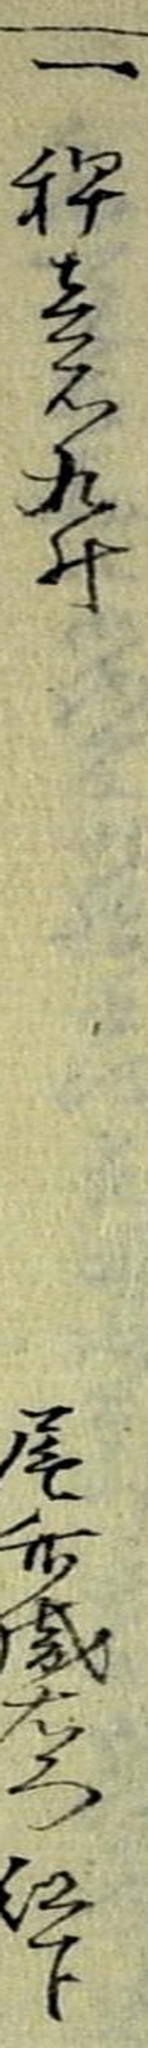一稗壱石九升尾竹織右衛門組下
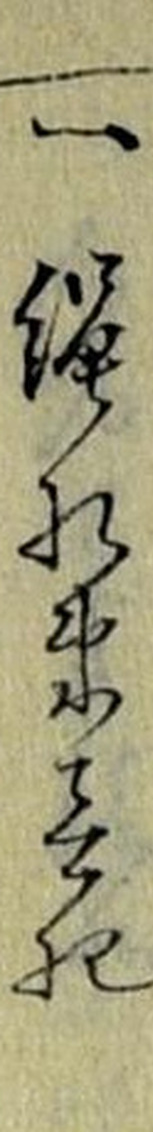一縄拾束壱把
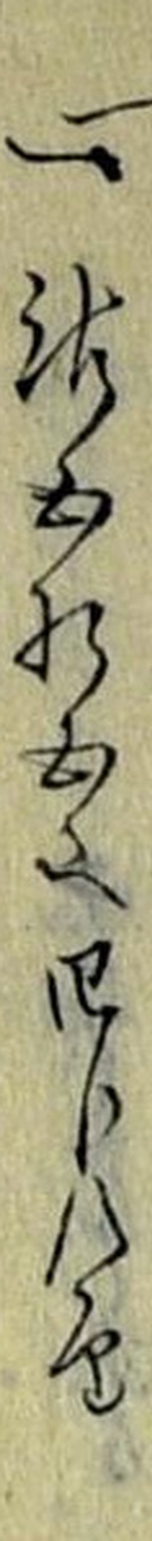一銀五拾五匁四分八厘
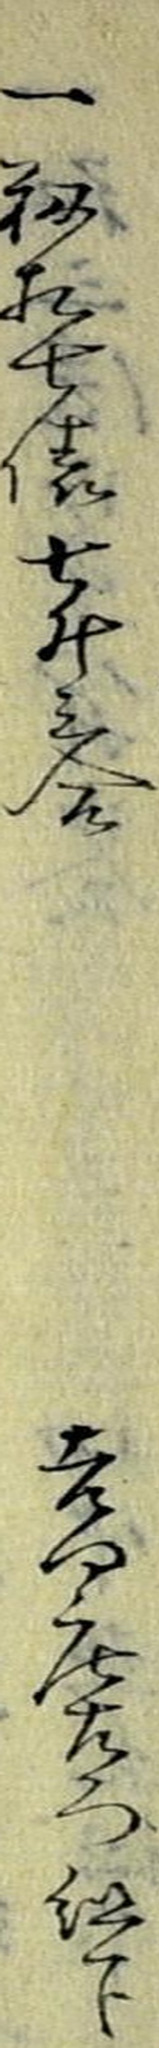一籾拾七俵七升三合吉田庄左衛門組下
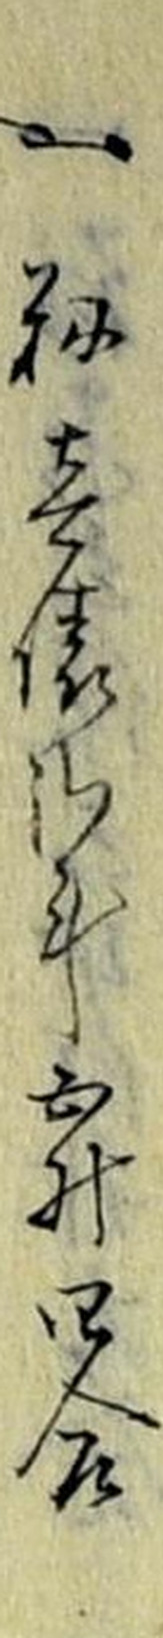一籾壱俵弐斗五升四合
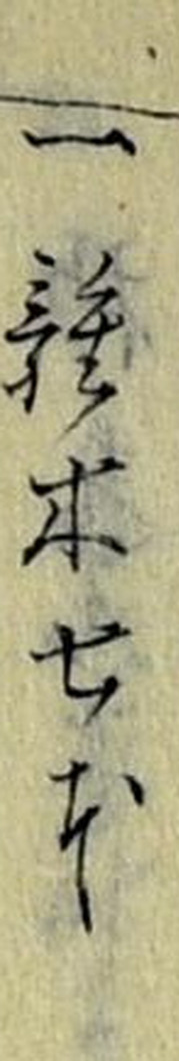一雑木七本
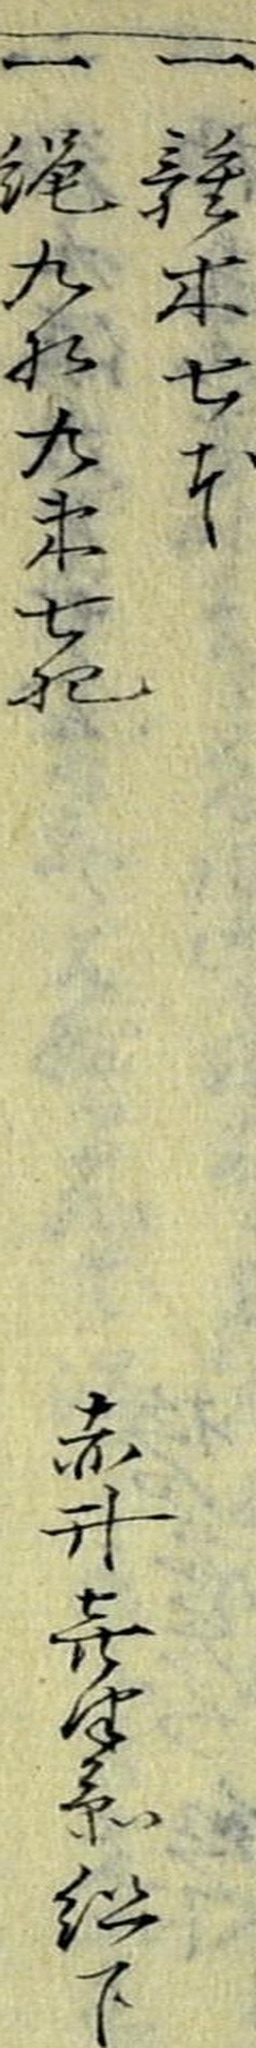一縄九拾九束七把赤井喜津兵衛組下
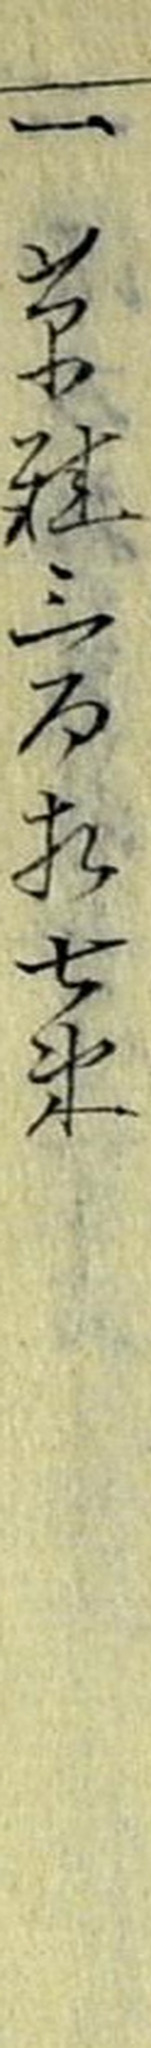一草鞋三百拾七束
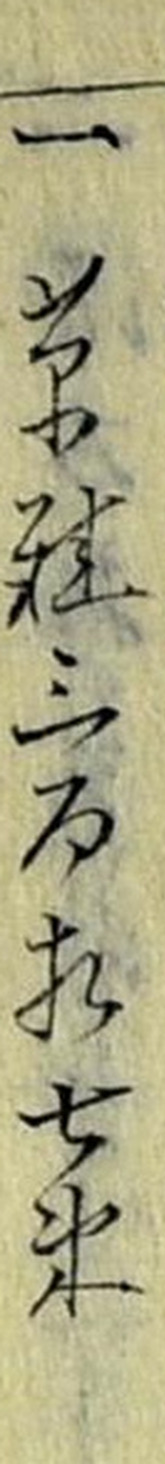一草鞋三百拾七束
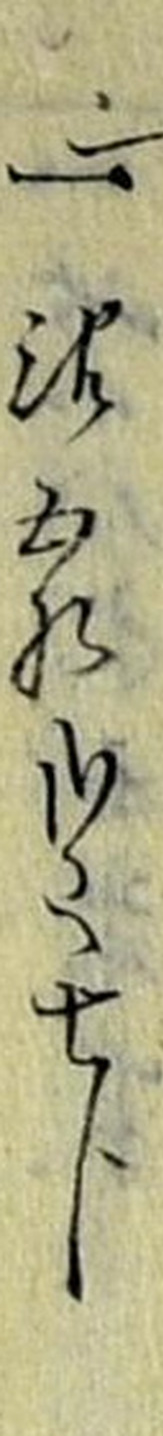一銀五拾弐匁七分
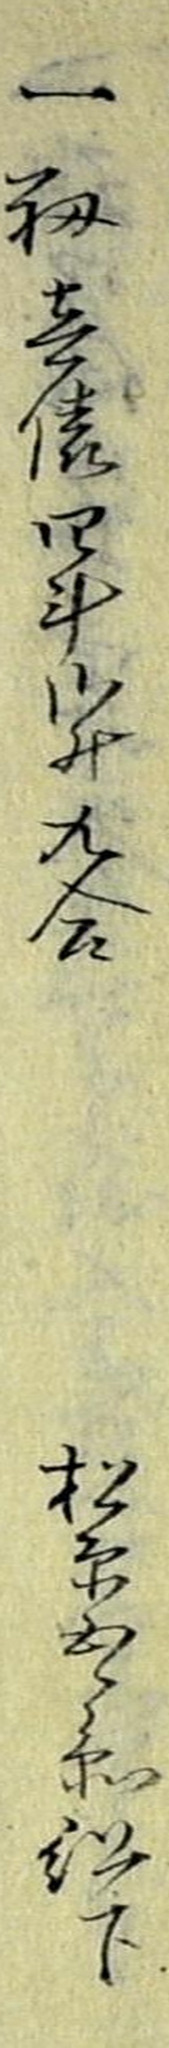一籾壱俵四斗弐升九合松原五兵衛組下
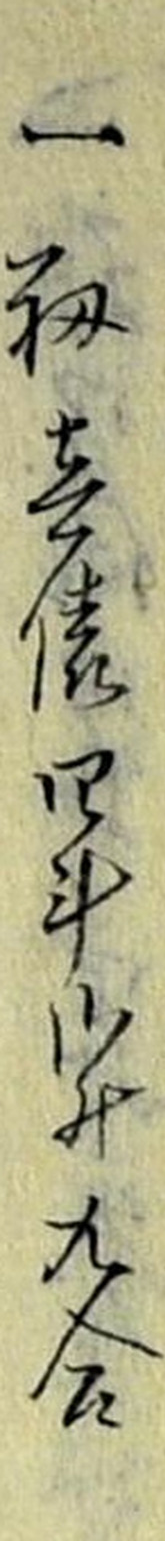一籾四石八斗弐升九合

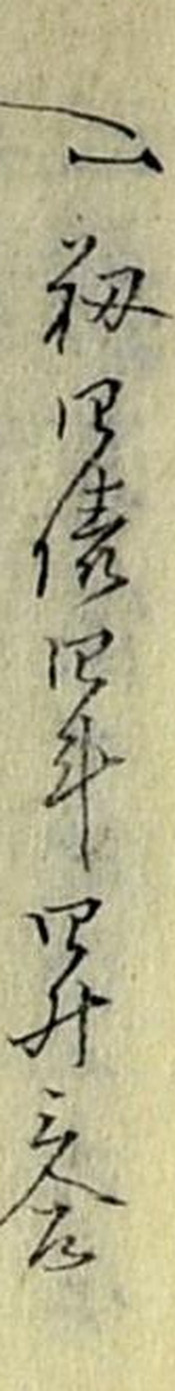一籾四俵四斗四升三合
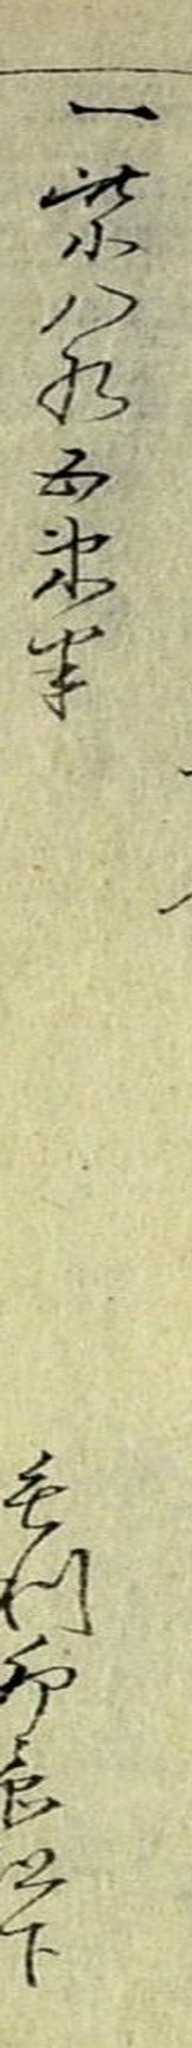一柴八拾五束半毛利卯兵衛組下
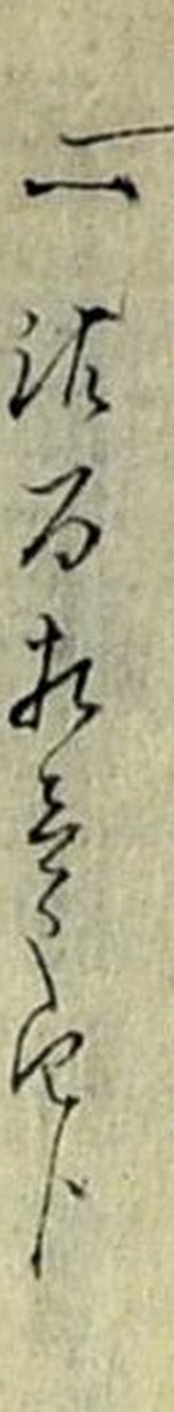一銀百拾壱匁四分
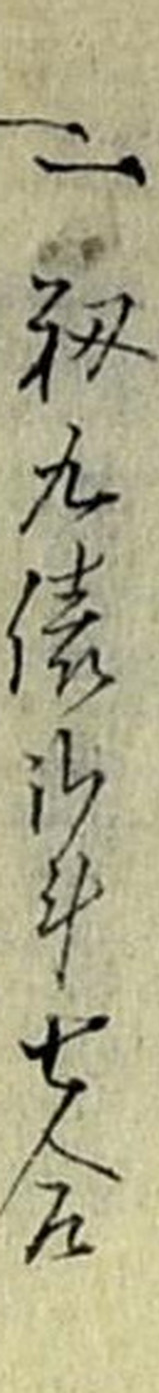一籾九俵弐斗七合
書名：命令之部 六
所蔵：福井県文書館 Fukui Prefectural Archives
